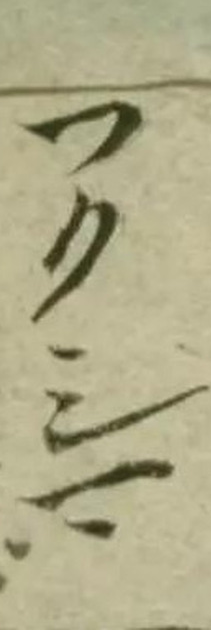フクシマ
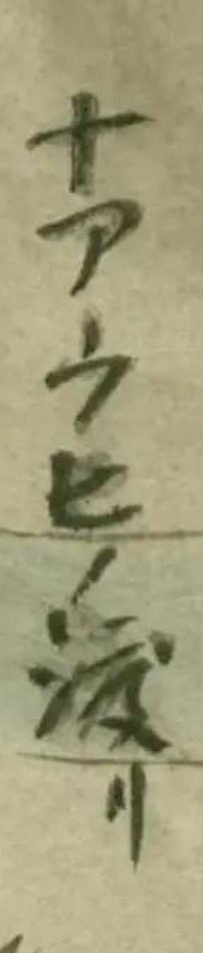十アラヒノ渡リ
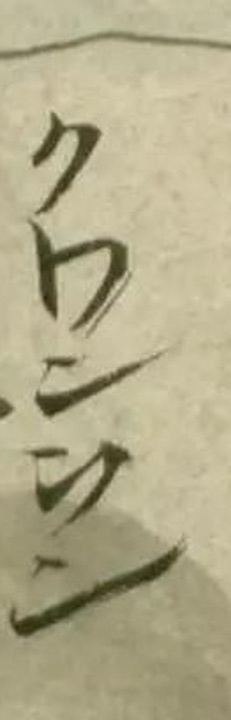クワンヲン
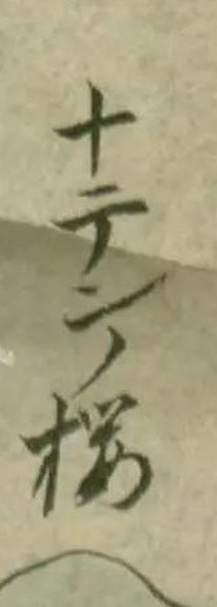十テンノ桜
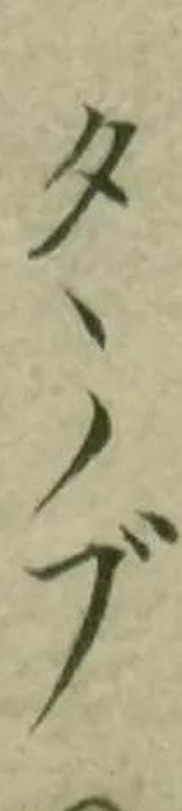タヽノブ
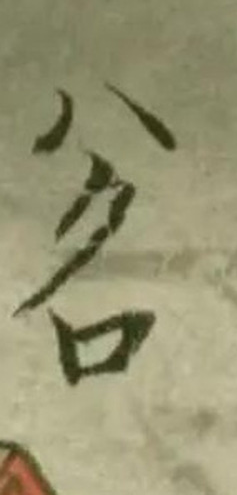ハクロ
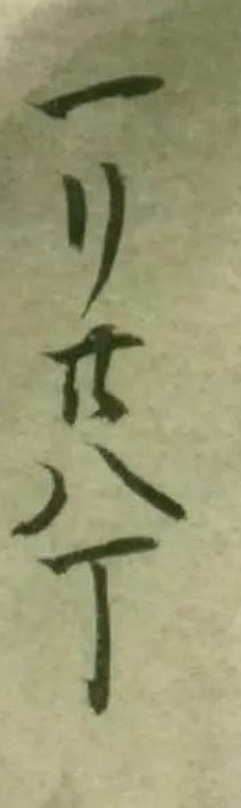一リ廿八丁
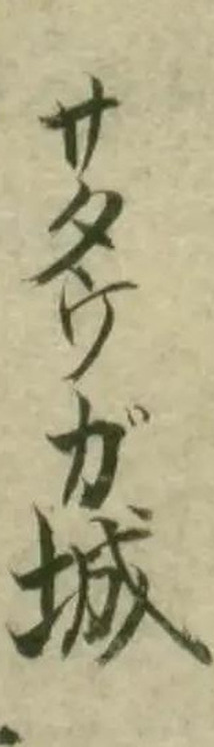サタウガ城
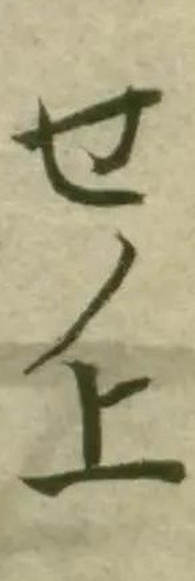セノ上

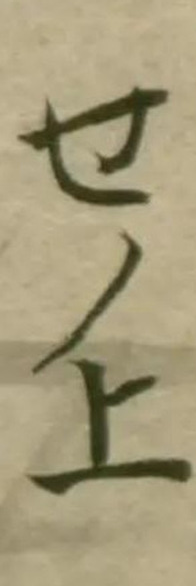セノ上
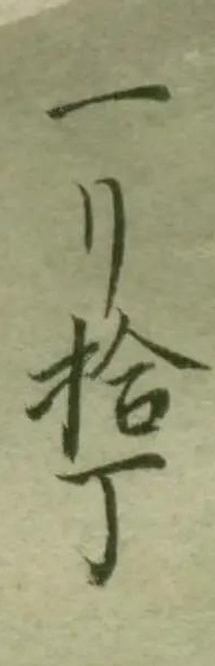一リ拾丁
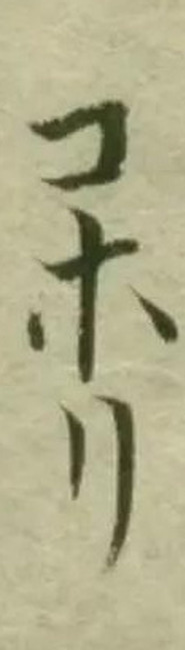コホリ
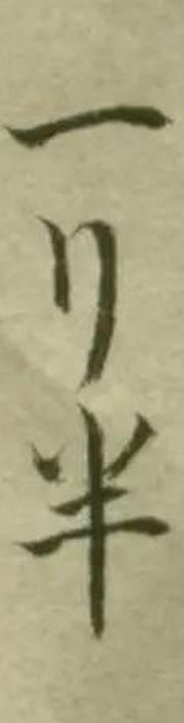一リ半
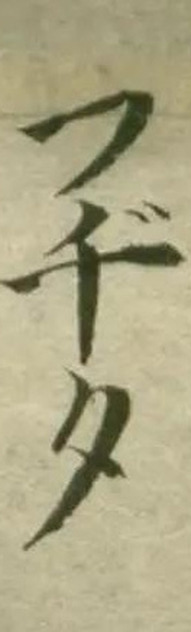フヂタ
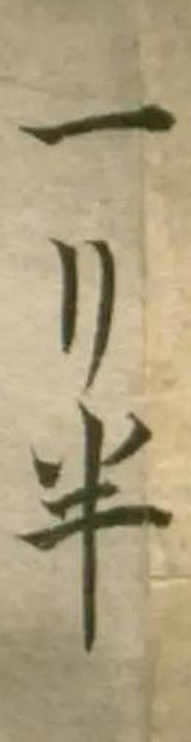一リ半

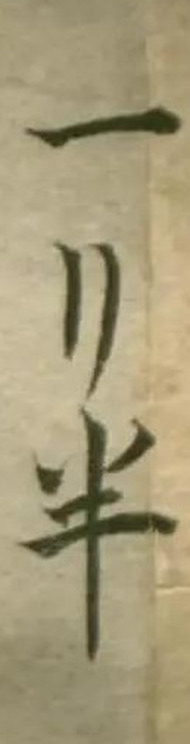一リ半
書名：江戸より奥州津輕迄道筋之圖
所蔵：国立国会図書館 National Diet Library, JAPAN
